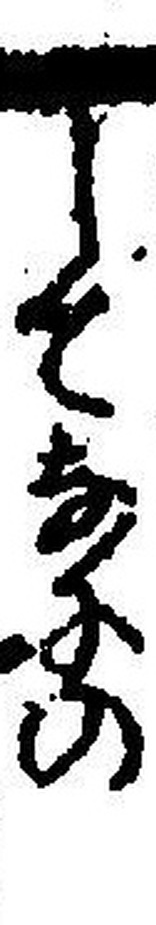してなにの
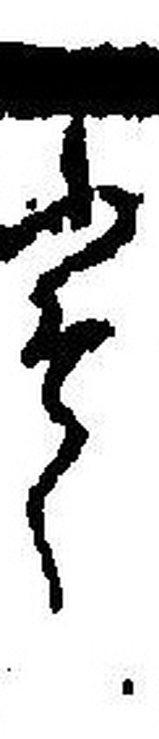ふそく
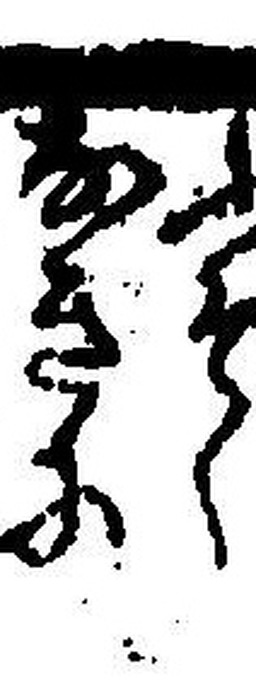なきに
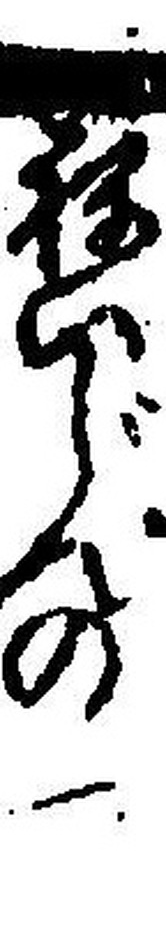ねいじんの
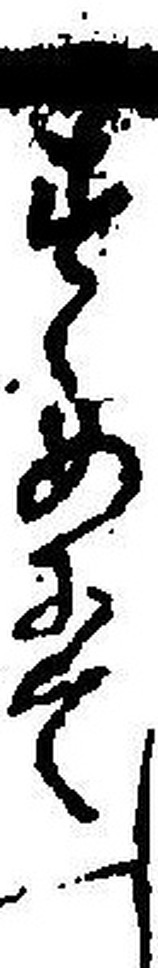すゝめにて
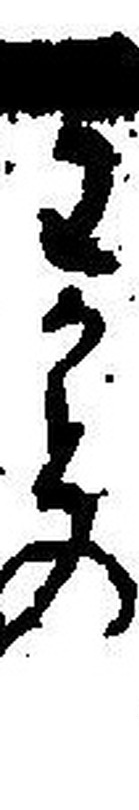わかとの
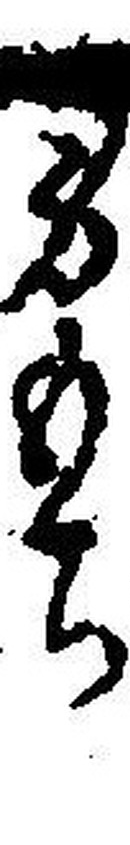身もち
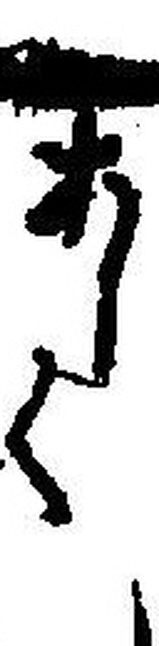あしく
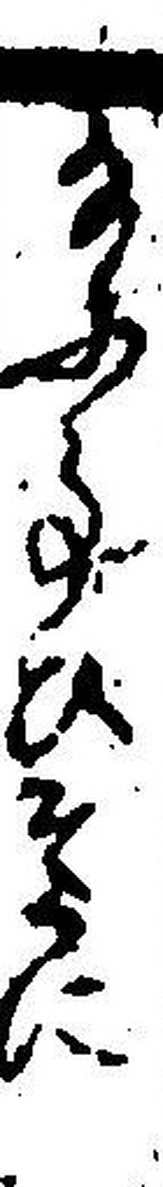給ふ事ひそかに
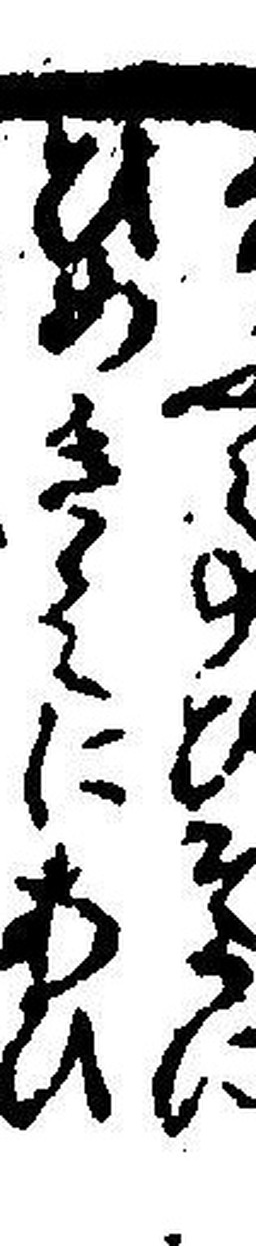ひめきみにあひ
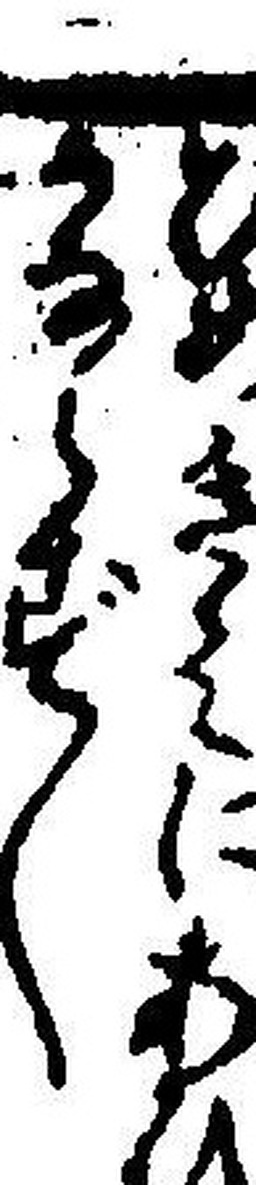かならず〳〵
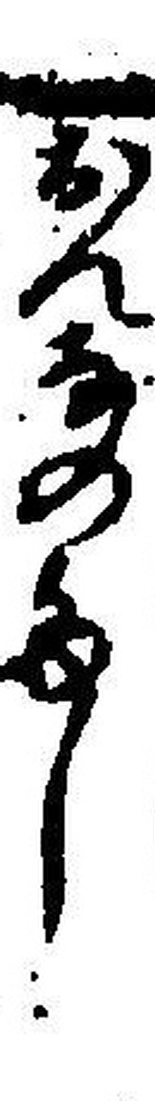おんなのたし
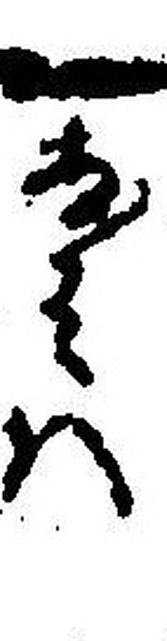なみは
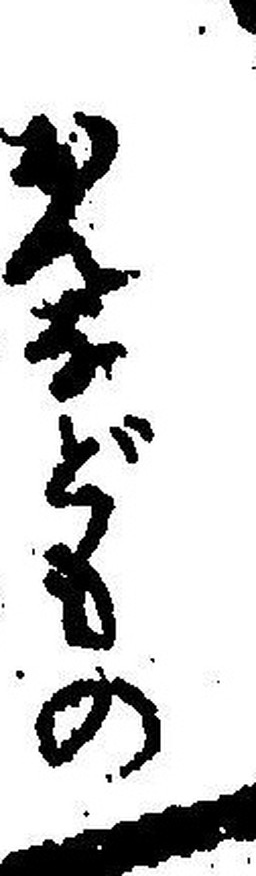おんなどもの
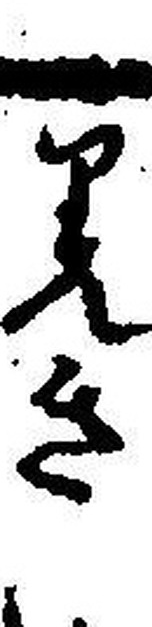りんき
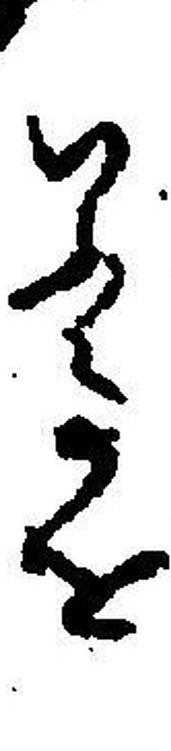いふ事を
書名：御代参牛時詣 / 市場通笑作
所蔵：東京大学総合図書館 General Library in the University of Tokyo, JAPAN
